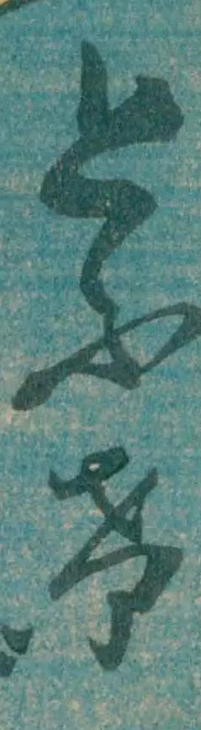どふけ

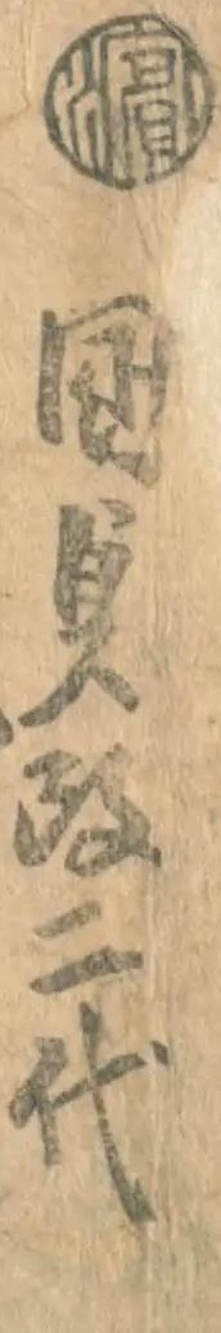国貞改二代
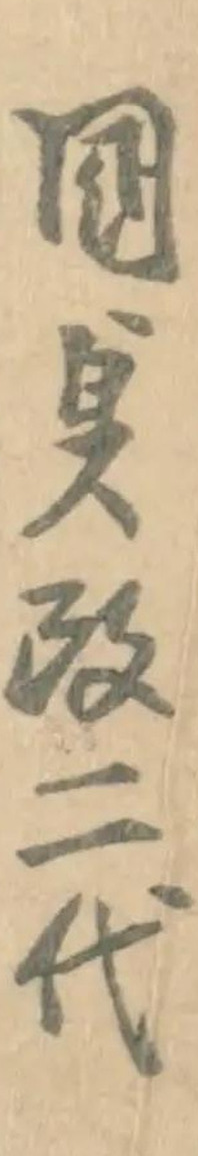国貞改二代
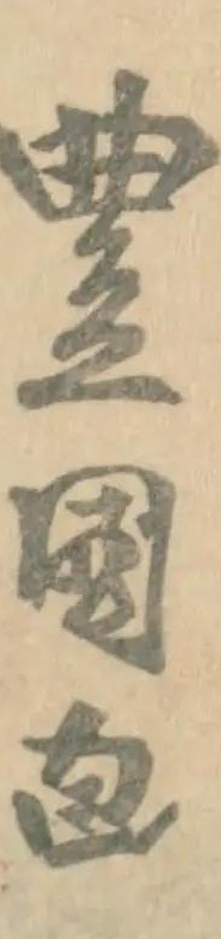豊国画

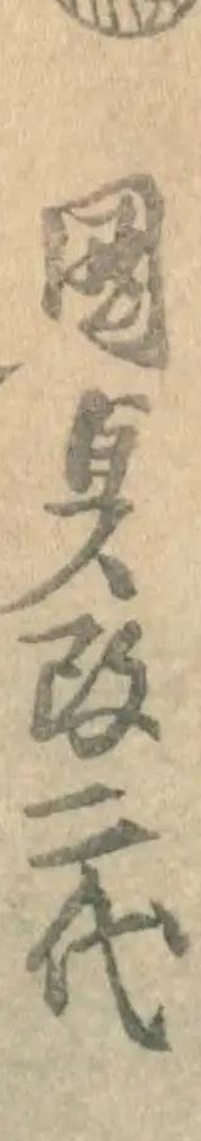国貞改二代
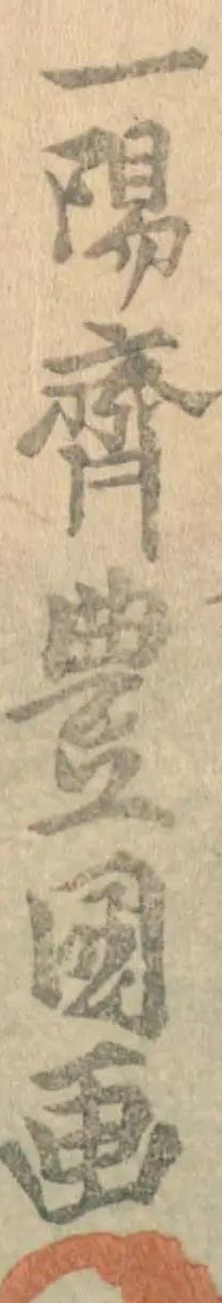一陽齊豊国画

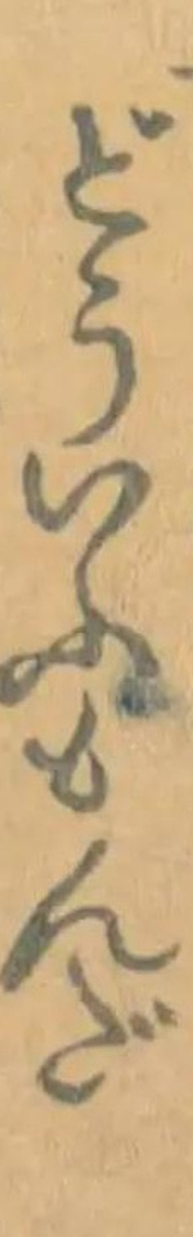どういふもんだ
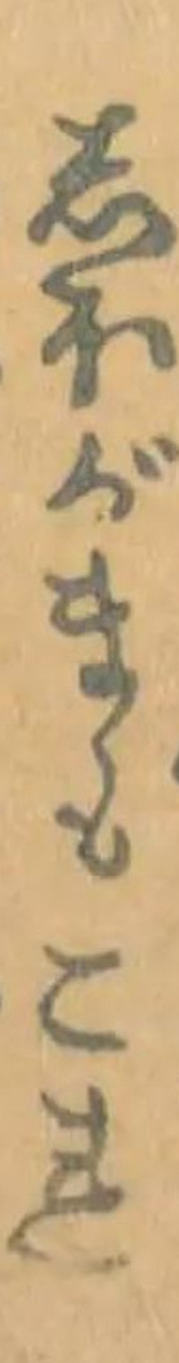しほがまもこれ
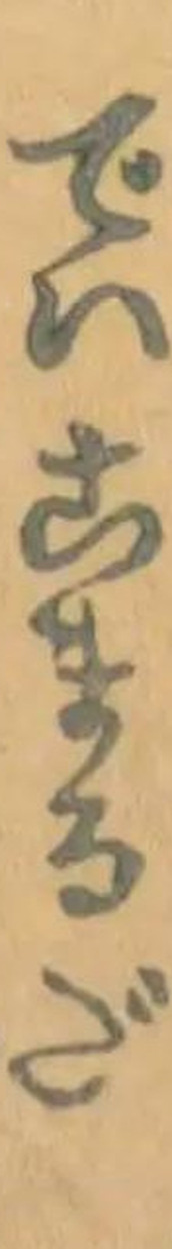ではこまるだ
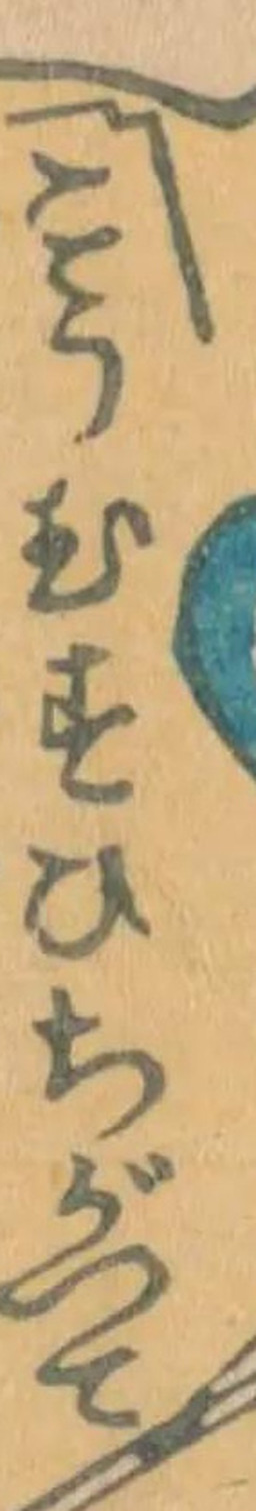〽こうむすひちがつて
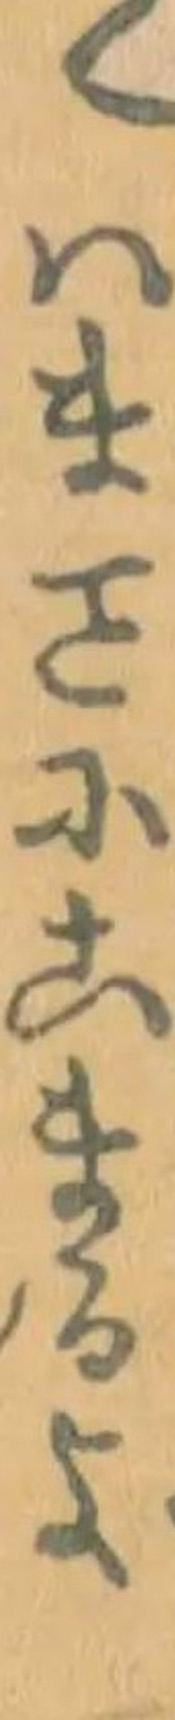いまことにこまるよ
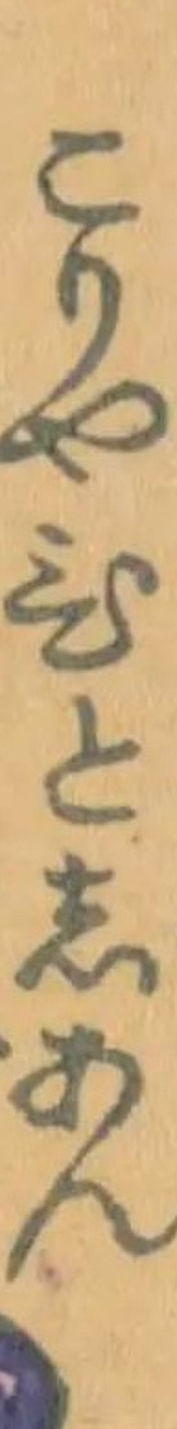こりやひとしあん
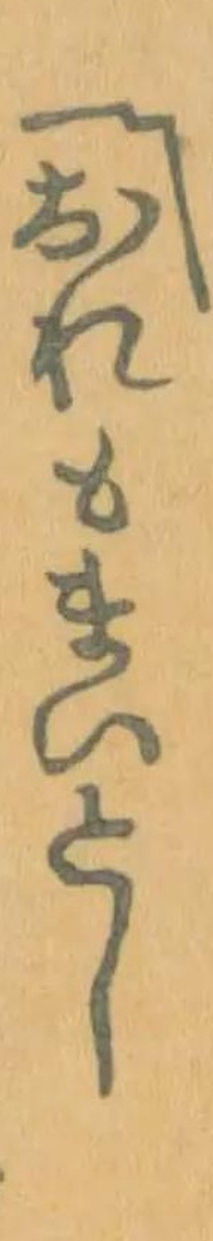〽おれもまいとし
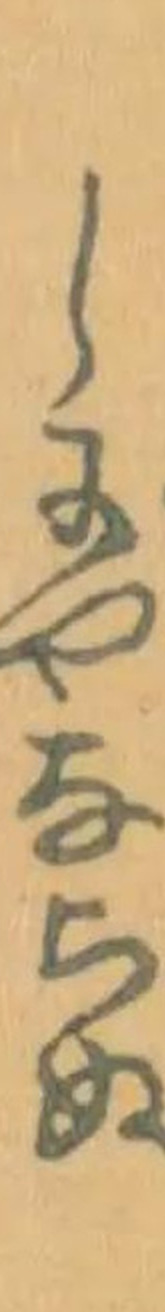しにやならぬ
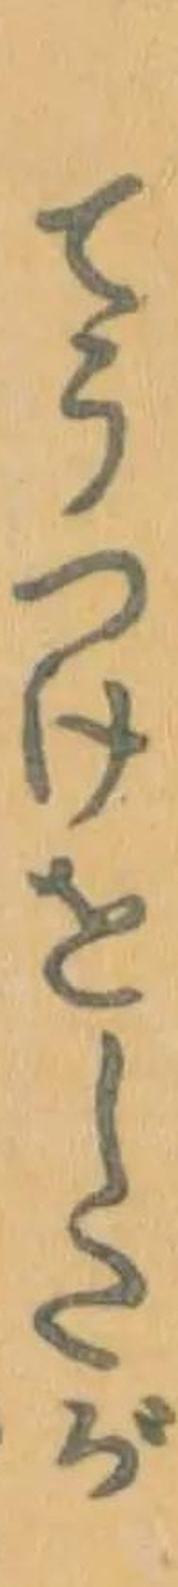てうつけをしたが
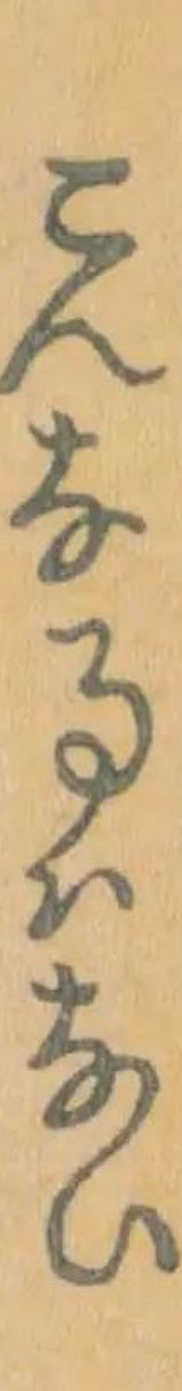こんな事はない
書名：国芳国貞錦絵
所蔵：国立国会図書館 National Diet Library, JAPAN
